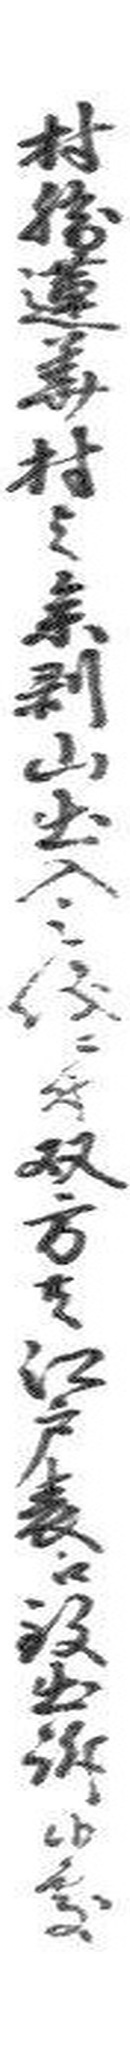村勝蓮華村と参剝山出入之儀ニ付双方共江戸表江致出訴候処

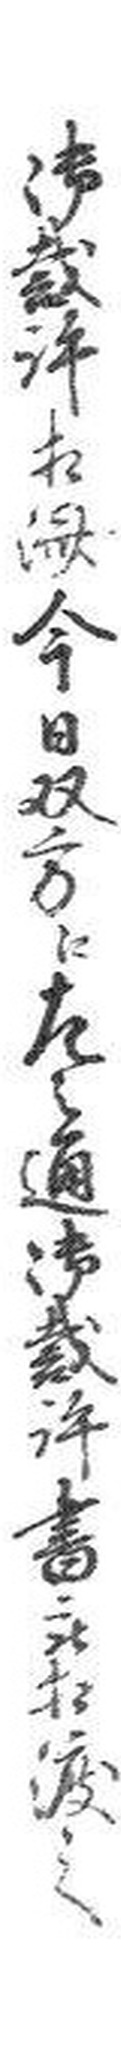御裁許相済今日双方江左之通御裁許書被相渡之
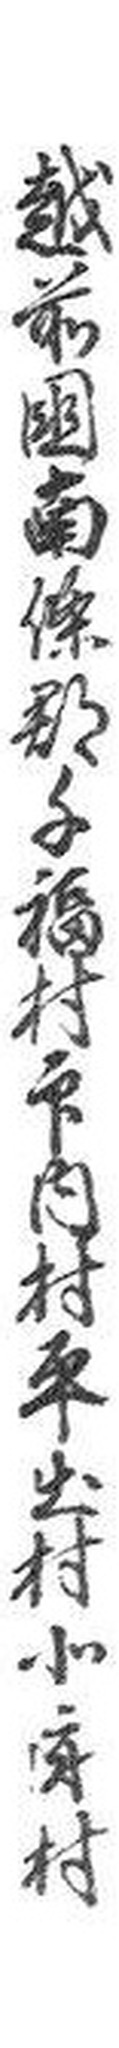越前国南条郡千福村印内村平出村北府村
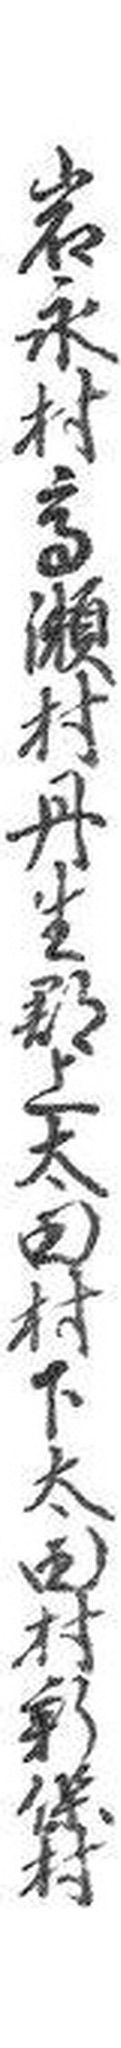岩永村高瀬村丹生郡上太田村下太田村新保村
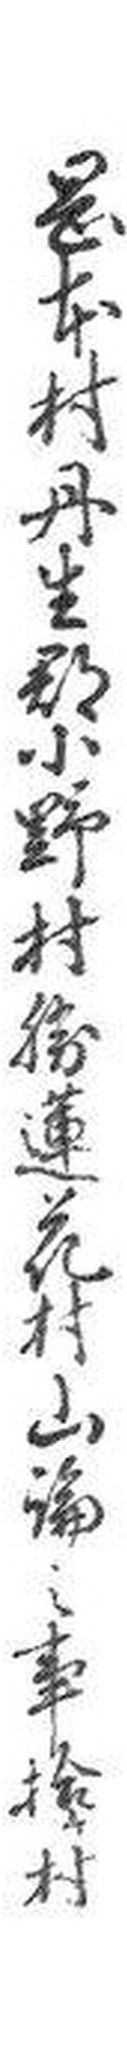岡本村丹生郡小野村勝蓮花村山論之事拾ヶ村
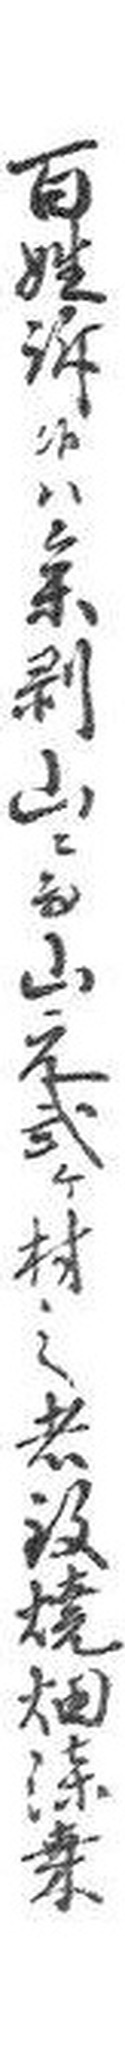百姓訴候ハ参剝山ニ而山元弐ヶ村之者致焼畑漆桑
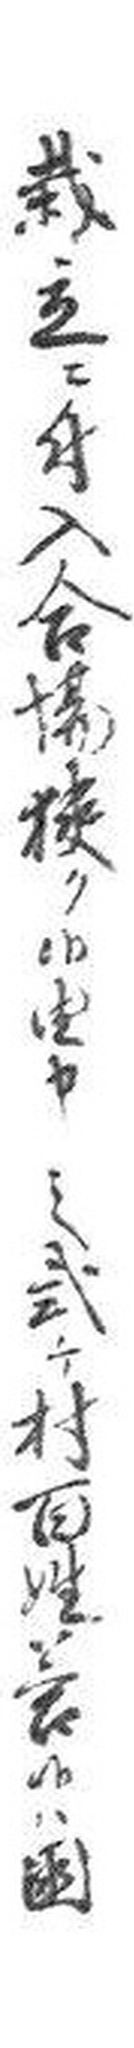栽立ニ付入合場狭ク候由申之弐ヶ村百姓答候ハ国
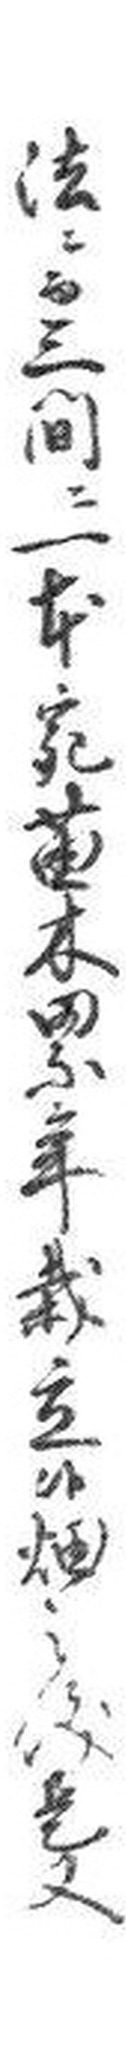法ニ而三間ニ一本宛苗木累年栽立候畑之儀是又
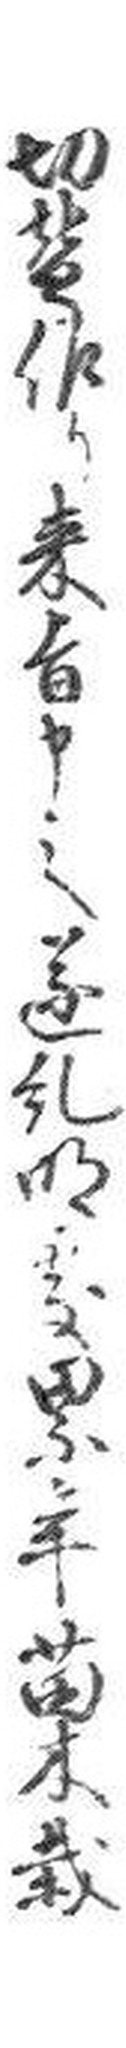切替作り来旨申之遂糺明処累年苗木栽
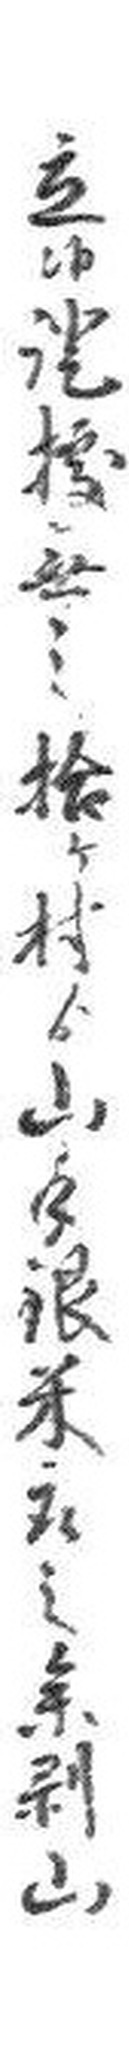立候証拠無之拾ヶ村ゟ山手銀米取之参剝山
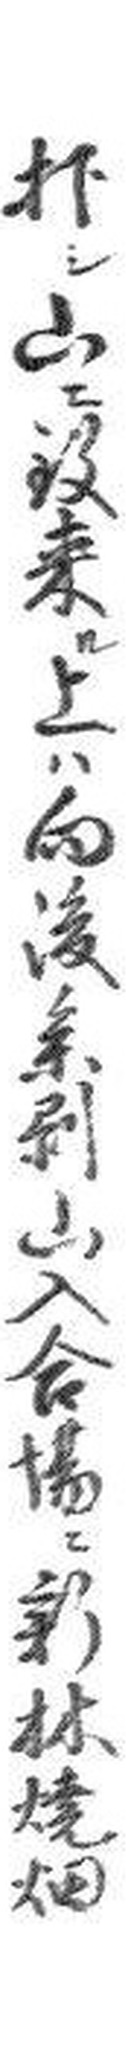シ山ニ致来ル上ハ向後参剥山入合場ニ新林焼畑
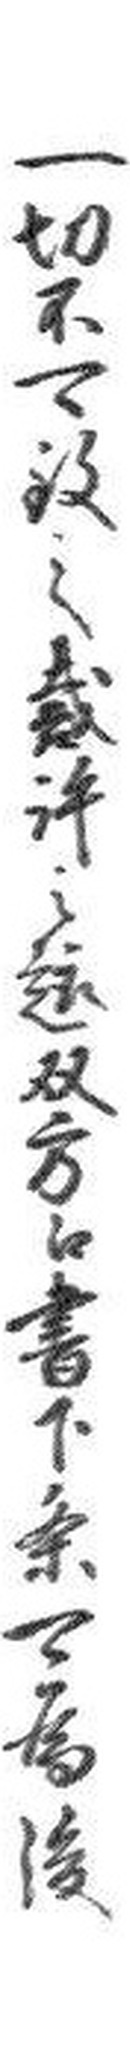一切不可致之裁許之趣双方江書下条可為後
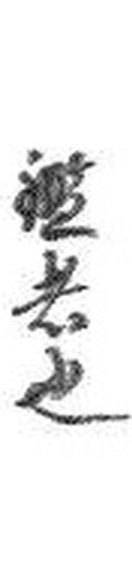鑑者也
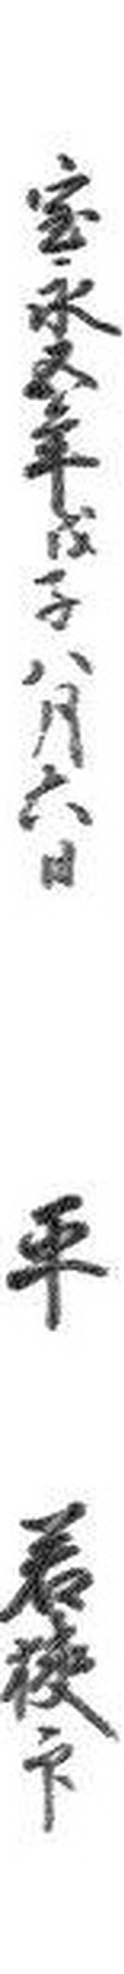宝永五年戊子八月六日平若狭印
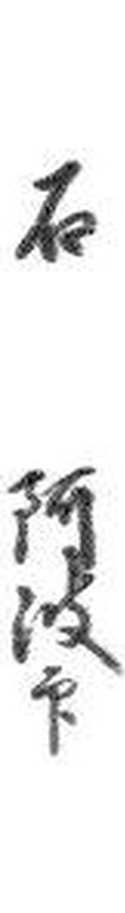石阿波印
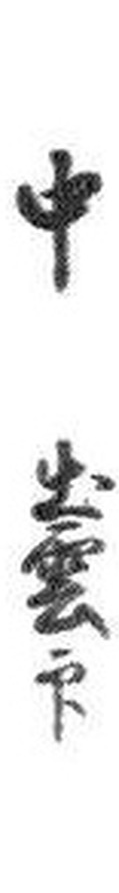中出雲印
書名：家譜 二十四 吉品公 従宝永三年到同五年
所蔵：福井県文書館 Fukui Prefectural Archives
